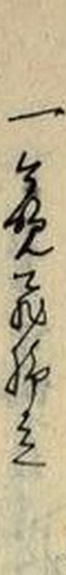一今晩飛脚立
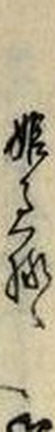姫君様へ
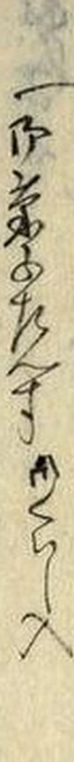御菓子たんす御くハし入
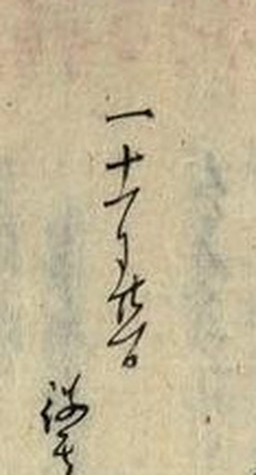一十一月廿一日
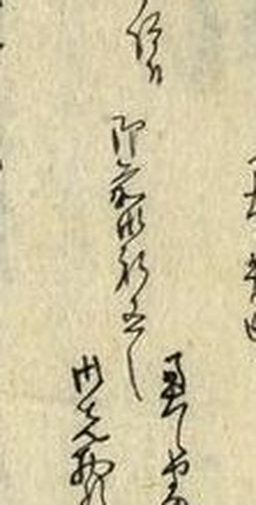御前御礼有之
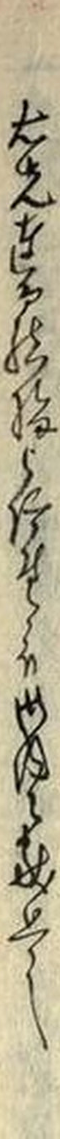右先達而結講被仰付候ニ付御内々献上之
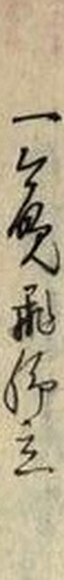一今晩飛脚立
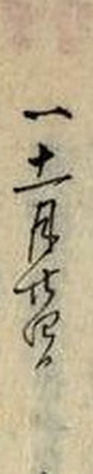一十一月廿一日
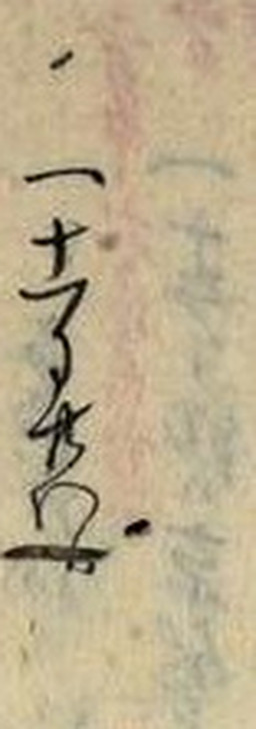一十一月廿一日

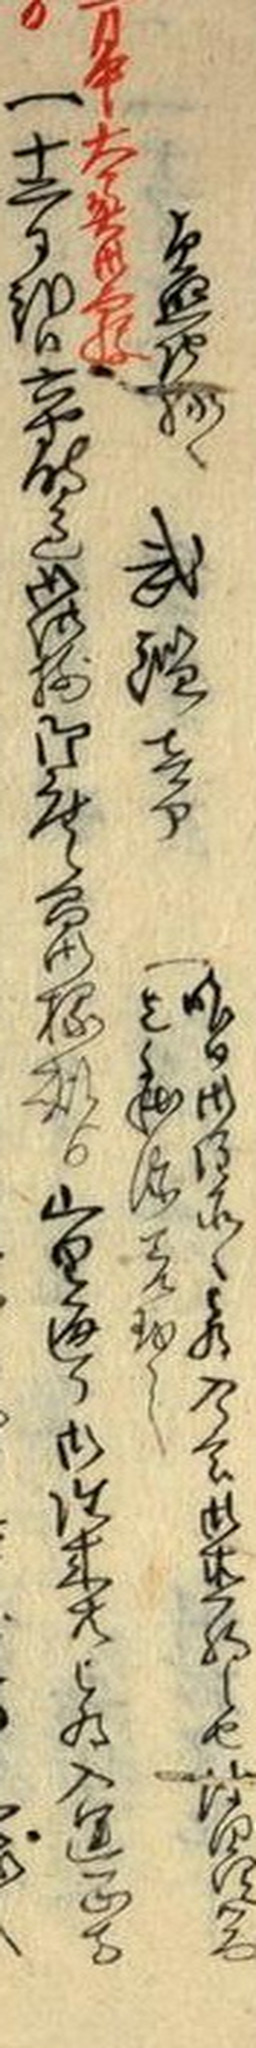一十二月朔日六半時過御供揃御座之間御縁頬ゟ山里通り御往来共被為入運正寺
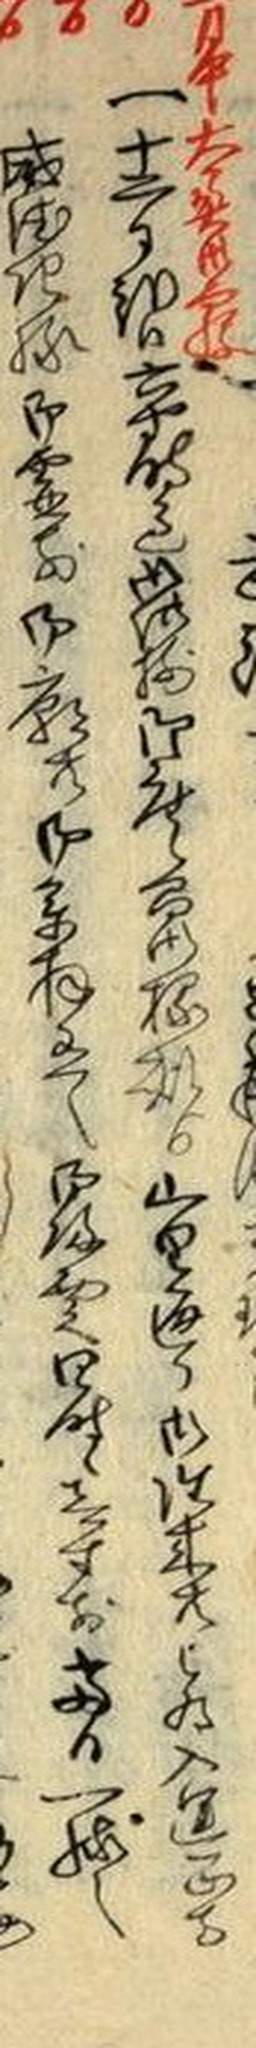威徳院様御霊前御廟共御参拝有之御帰殿四時へ壱寸前当日一統之
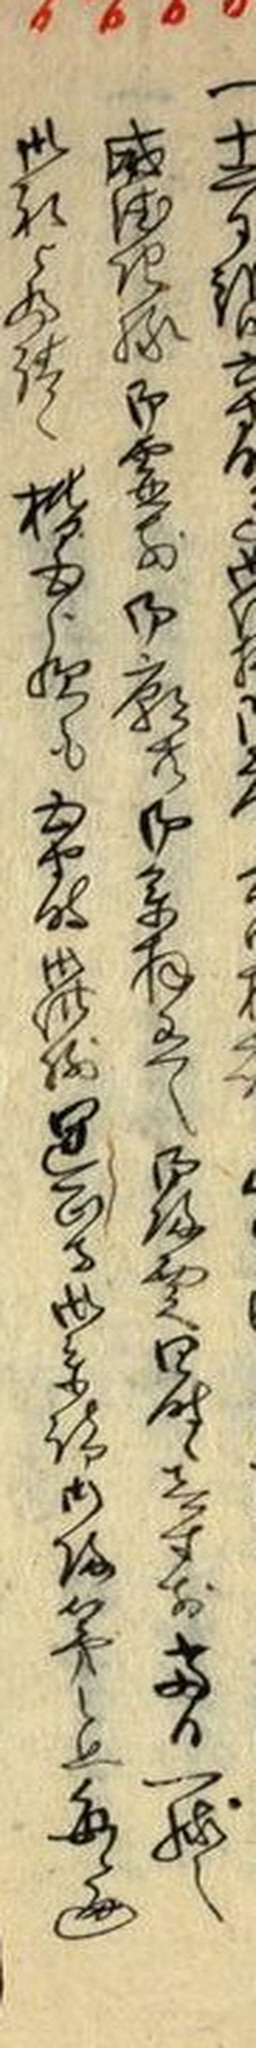御礼被為請候揩五郎様も五半時御供揃運正寺御参詣御帰第之上毎之通
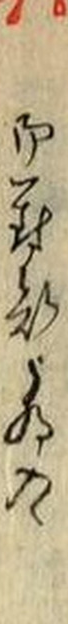御対顔被為入候
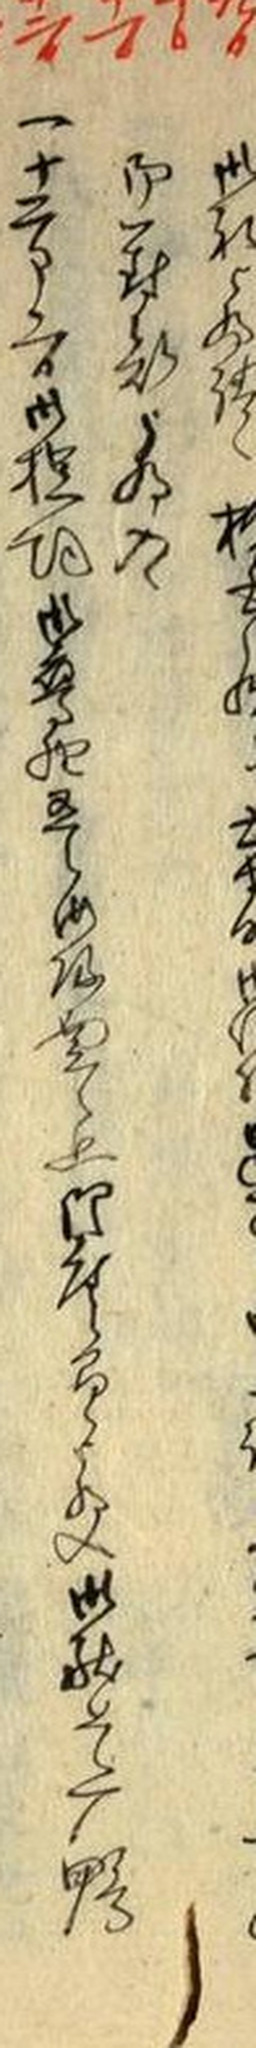一十二月二日御捉飼御鷹野有之御帰殿之上御座之間へ被為入御献上候厂鴨
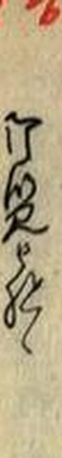御覧被遊候
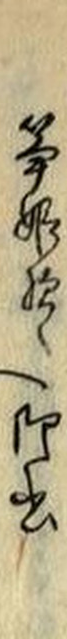箏姫様へ御書
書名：少傅日録抄（斉承付側向頭取日記、在国）
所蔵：福井県文書館 Fukui Prefectural Archives
